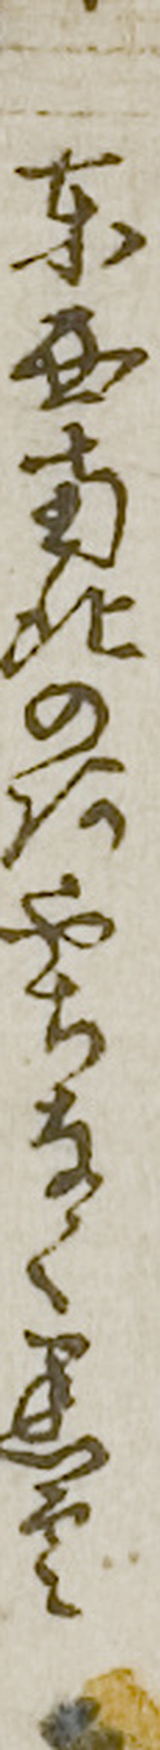東西南北のあやちなく黒雲
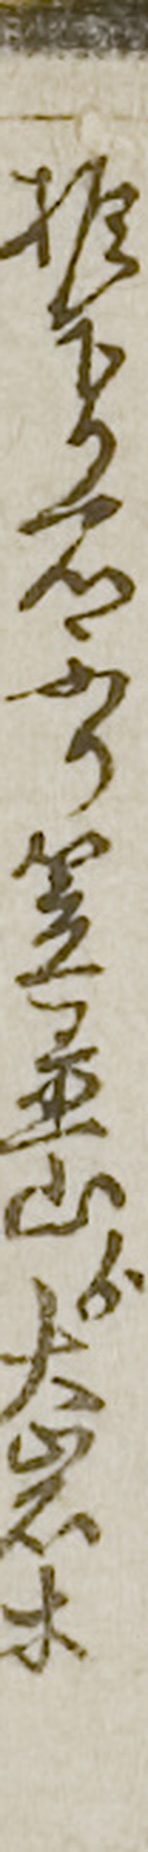振下り石ふり笠置山より大岩木
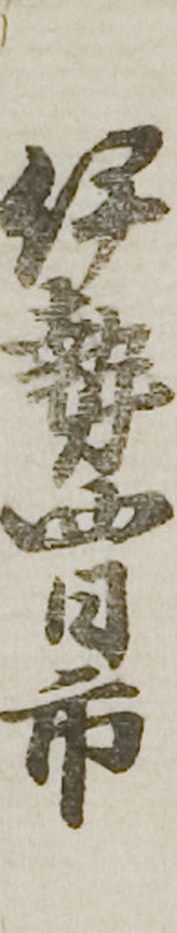伊勢四日市
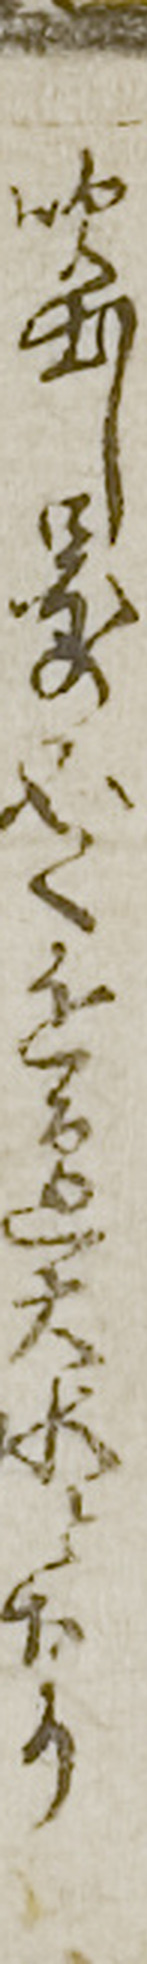吹出し図の如く近辺大水となり
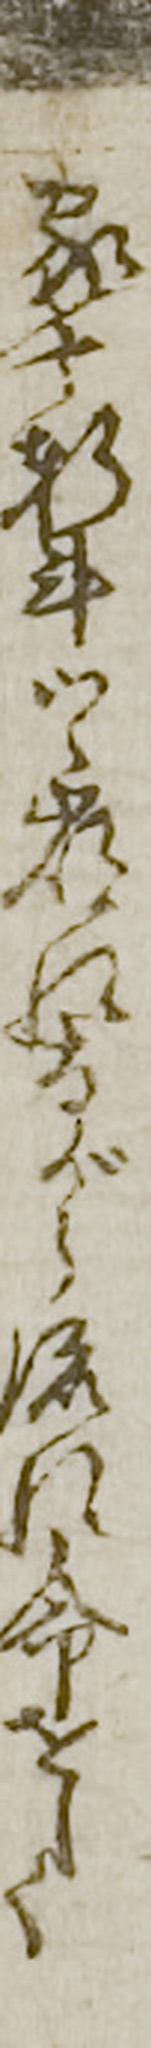家十軒斗つゝ崩れながら流れ命をしく
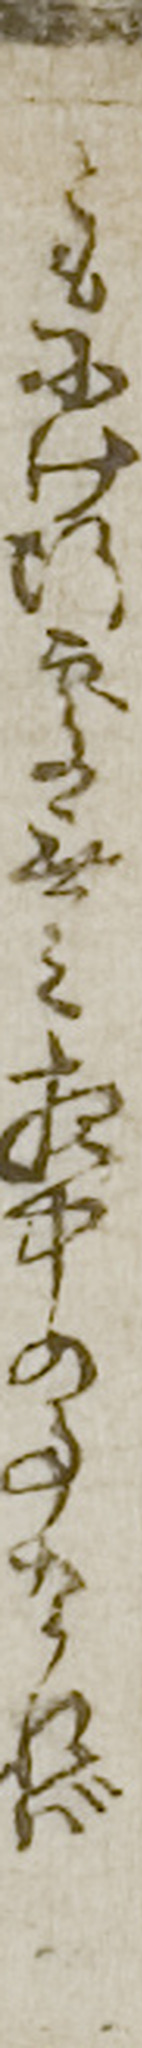ともにけ行処無之夜中の事なれば
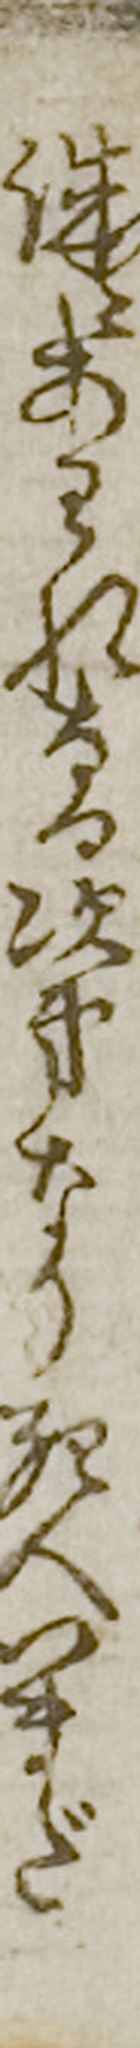誠にあわれなる次第なり死人いまだ
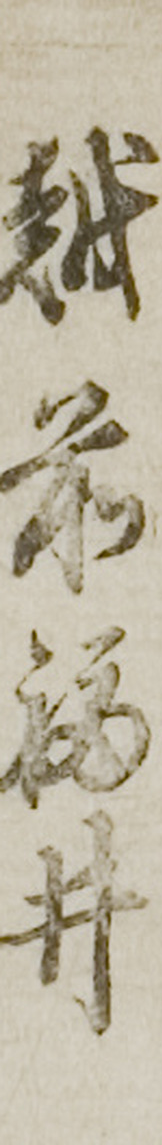越前福井
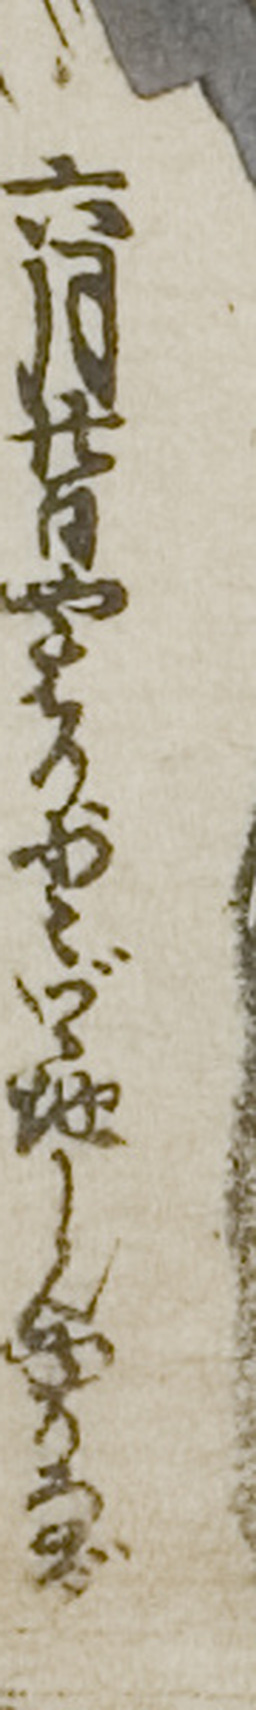六月廿日やはん少々づゝ地しんゆりなが
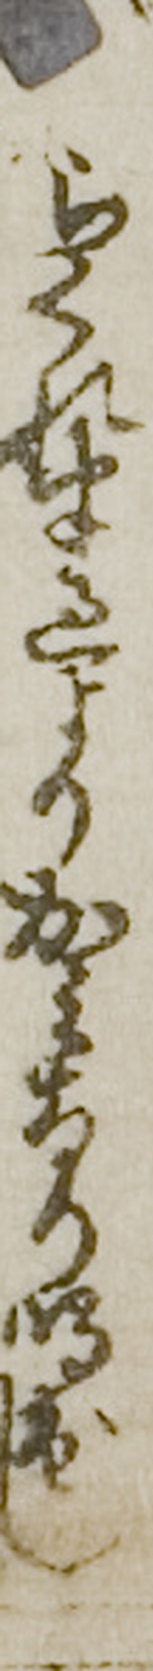らくれ半過よりかみなり鳴出し
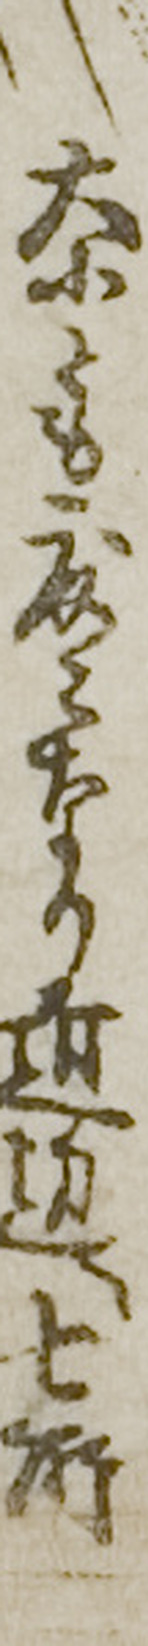大小とも度々なり近辺へ七所
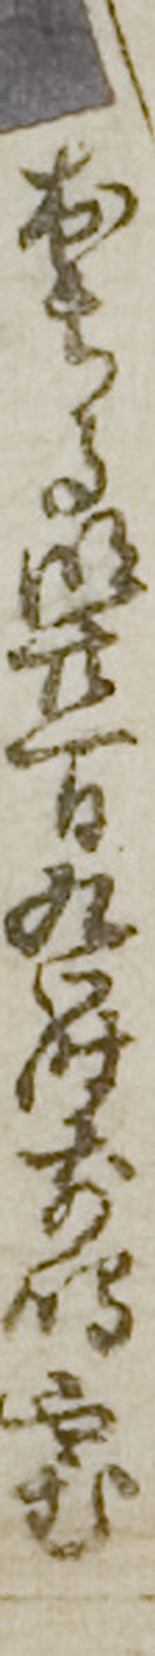おちる明廿一日九つ時前鳴やむ
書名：早飛脚廻りにてくわしき所本しらべ大地震
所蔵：東京大学総合図書館 General Library in the University of Tokyo, JAPAN
